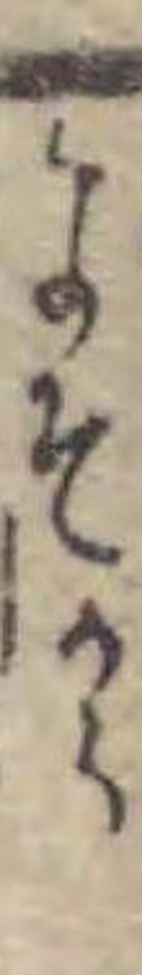よそから
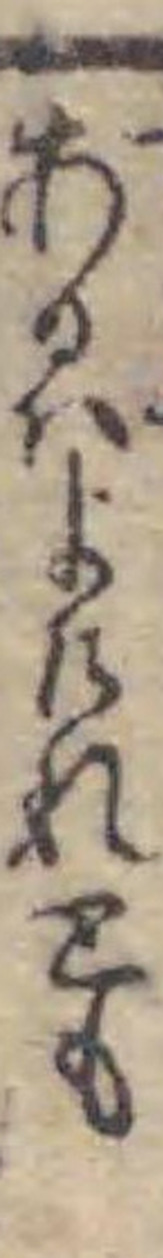あるはよけれとも
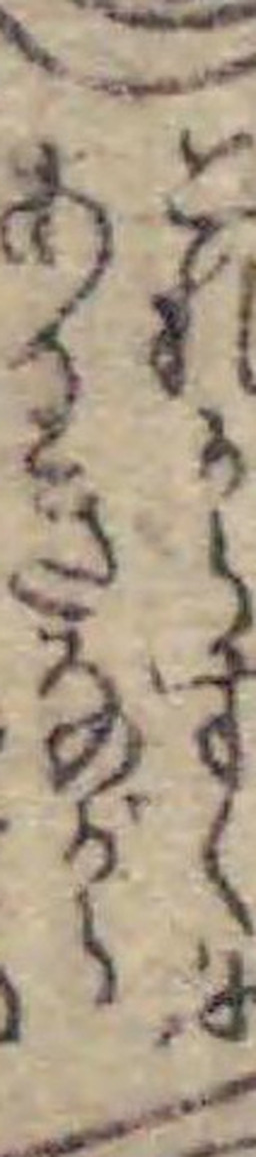あるきながら
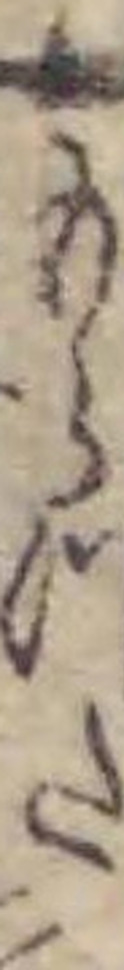もらつた
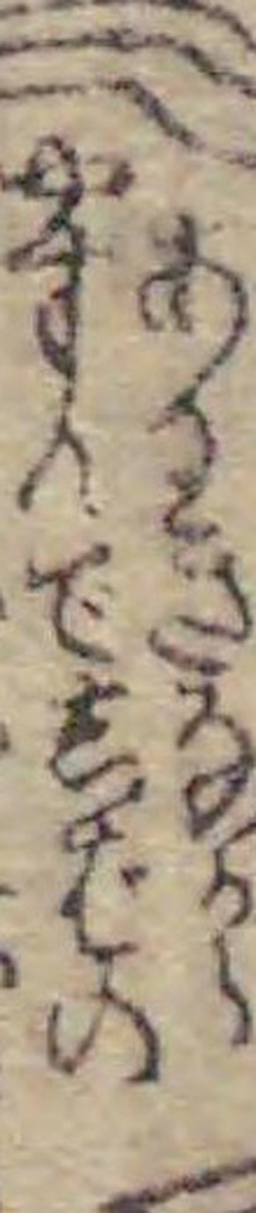やすんでしばの
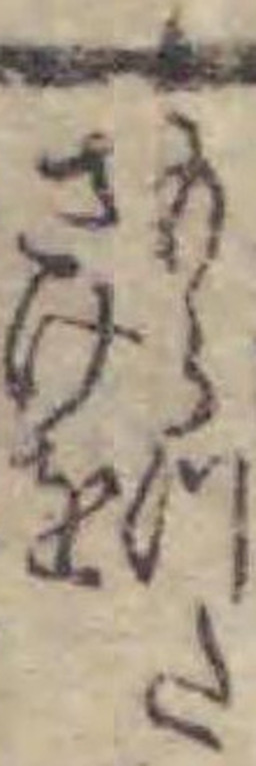さけを
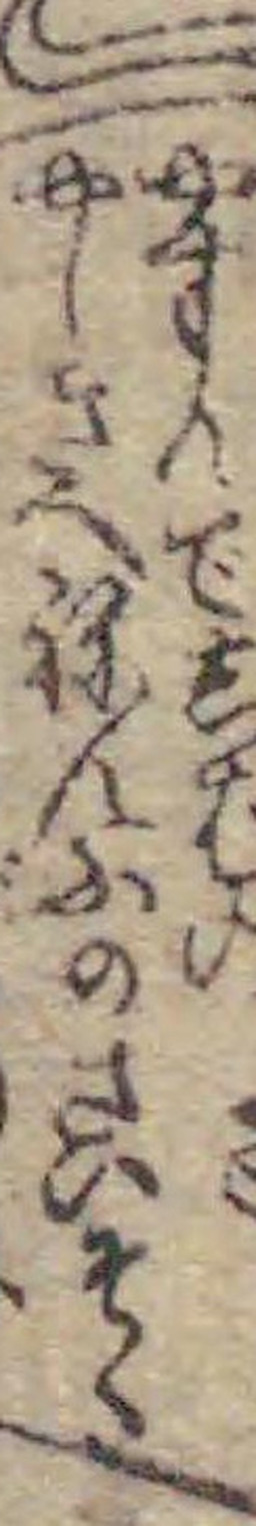やしきへねんふのさいそく
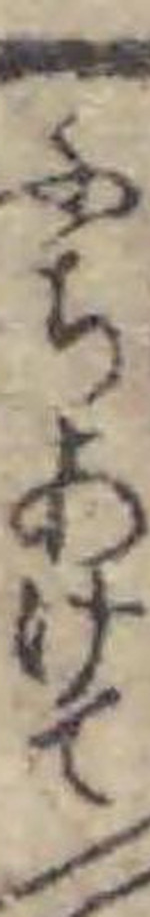ふちあけて
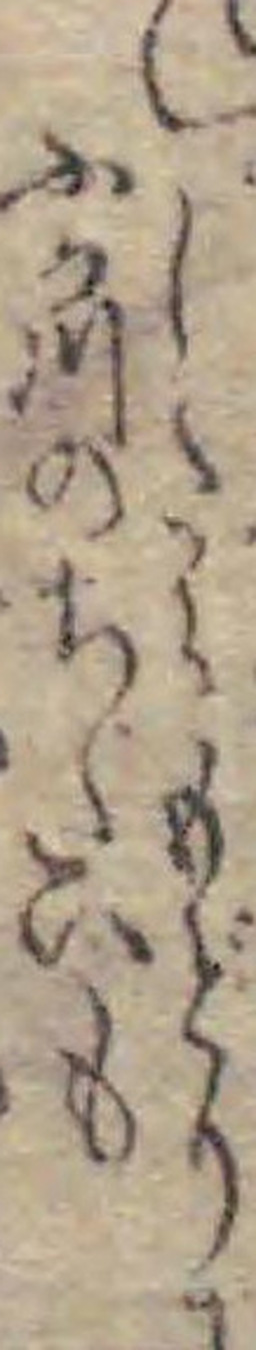ふか川のちだいも
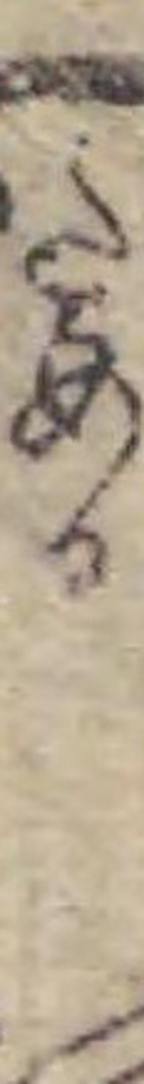ためる
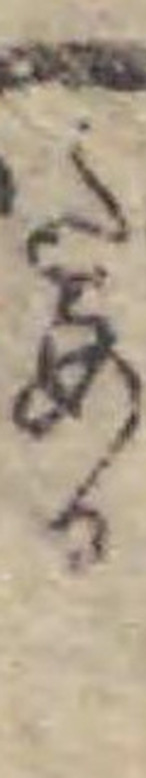ためる
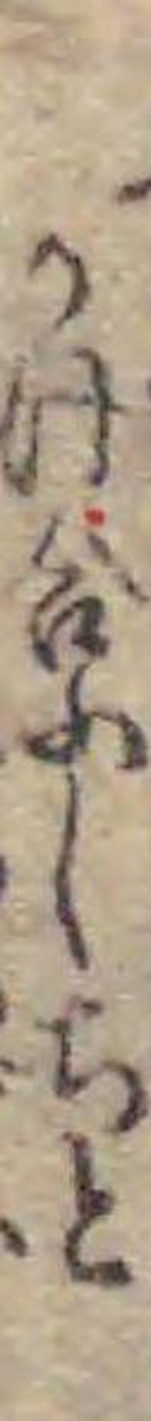かけ合ふしちと
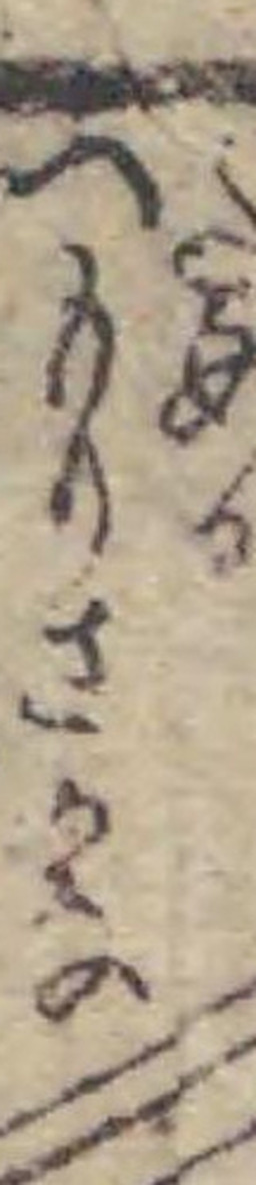つもりさかな
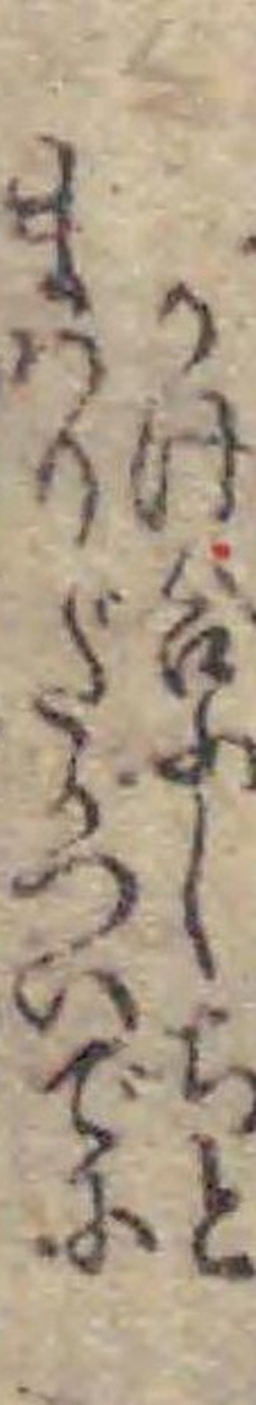まはりだかついでに
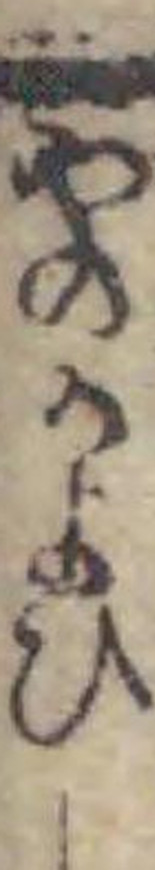やのかよひ
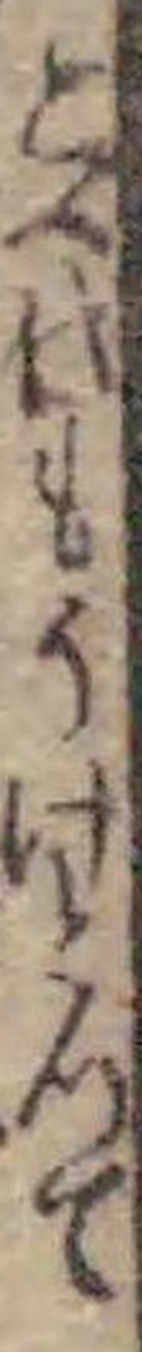こへ代もうけとつて
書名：新鋳小判 : 3巻
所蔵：国立国会図書館 National Diet Library, JAPAN
